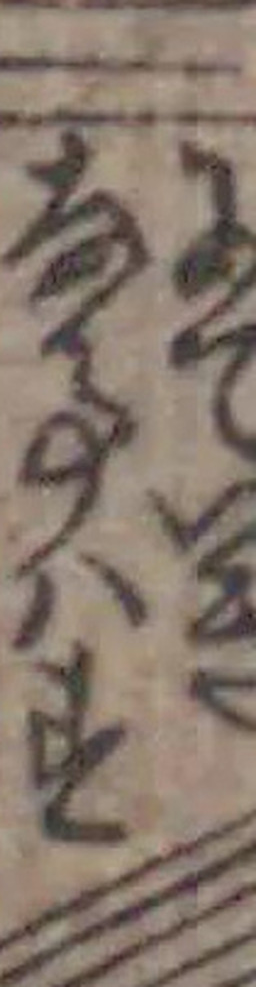な事はす
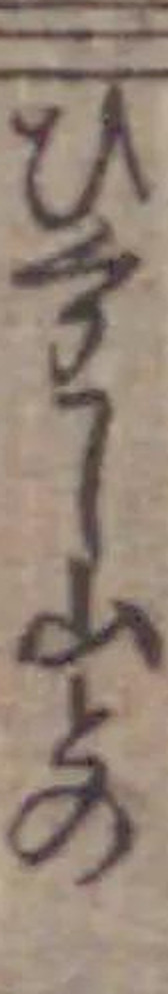ひくわし山との
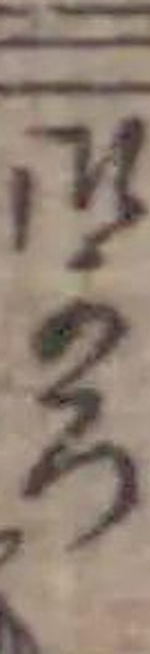御よろ
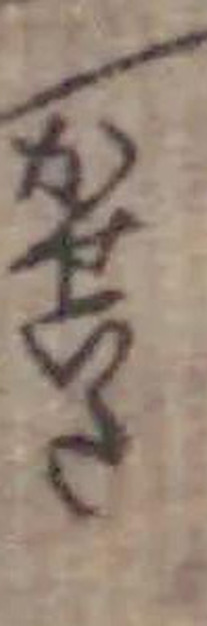かせいた

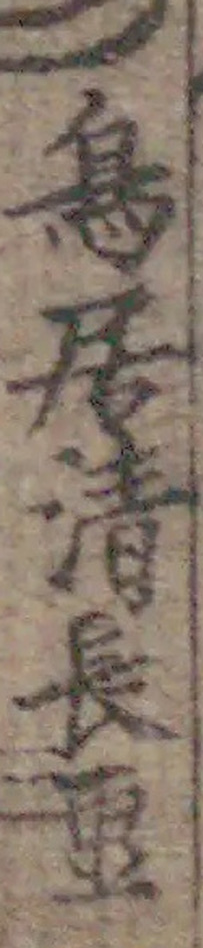鳥居清長画
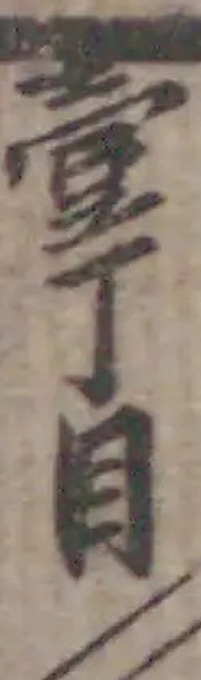壱丁目
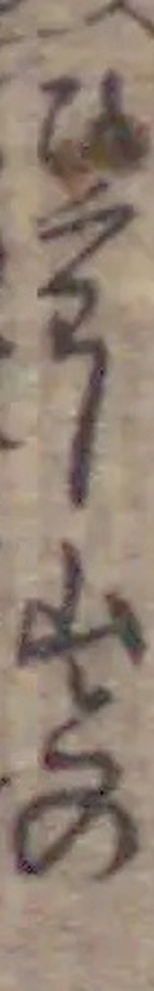ひくわし山との
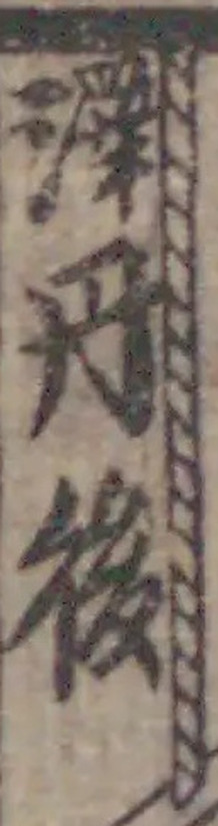澤丹後
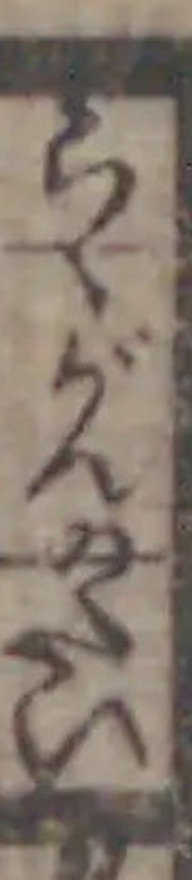らくがんのたい
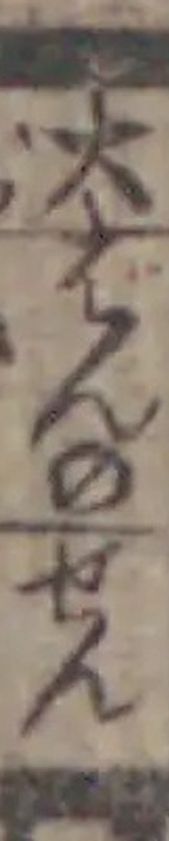大ばんのせん
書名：名代干菓子山殿 3巻
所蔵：国立国会図書館 National Diet Library, JAPAN
